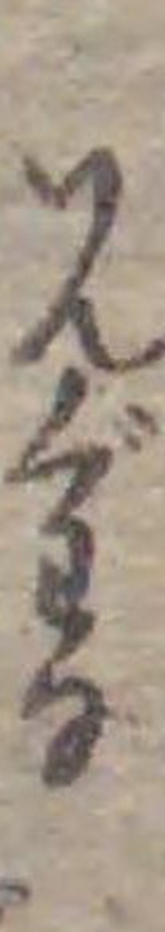いんぐわな
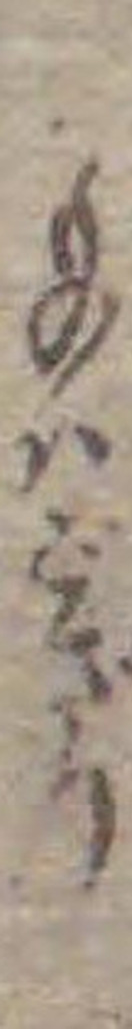ものはござり

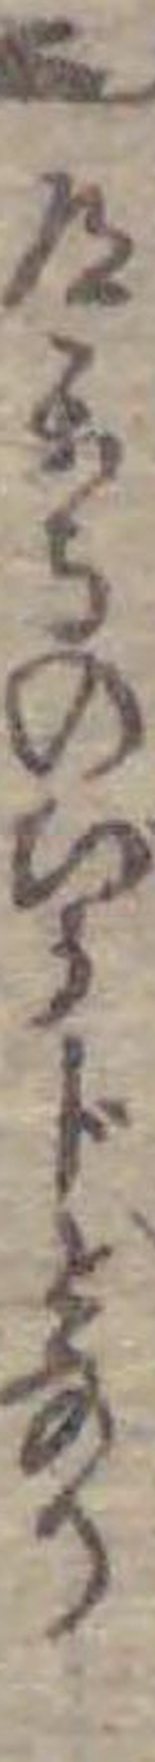道楽寺のぢうじとなり
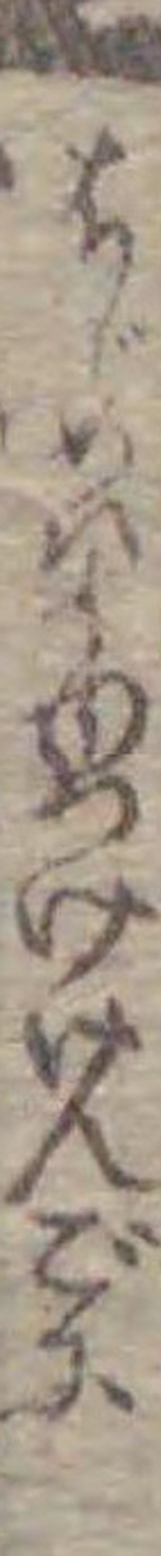はじめはしゆつけけんごに
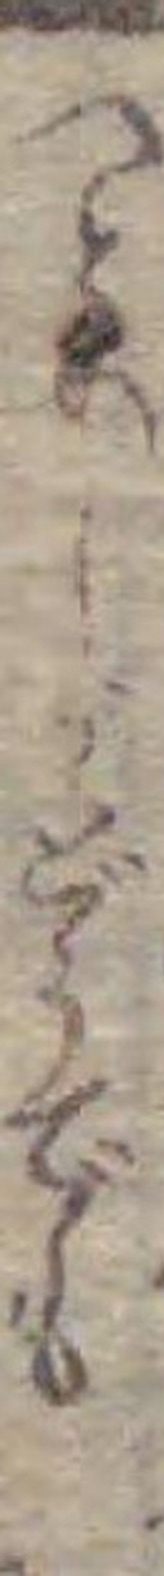つとめしがどうでも
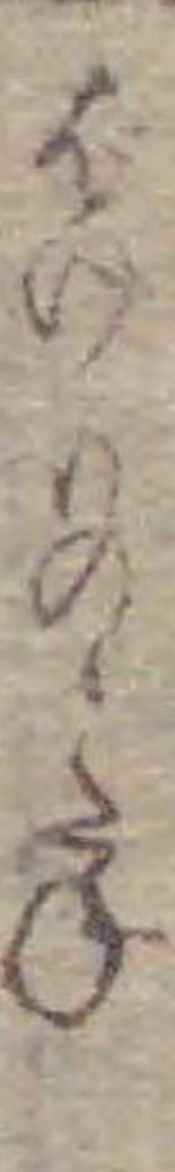ばけものゝたね
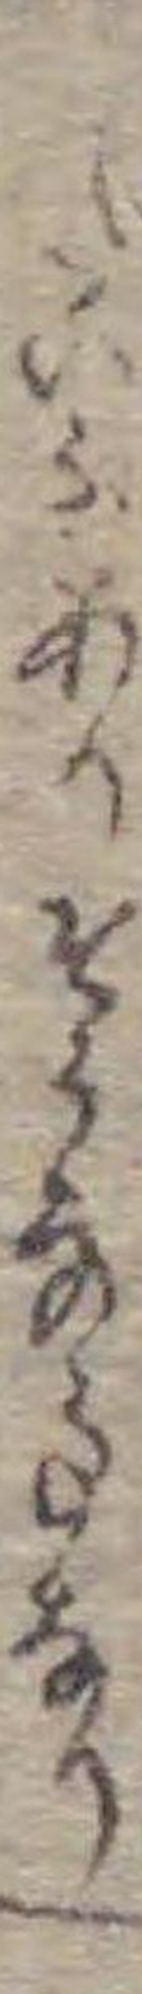だいふありそうな事なり
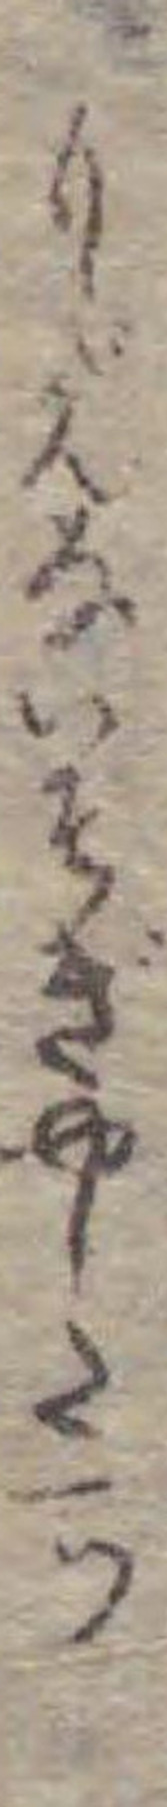もしだんないそぎやした一つ
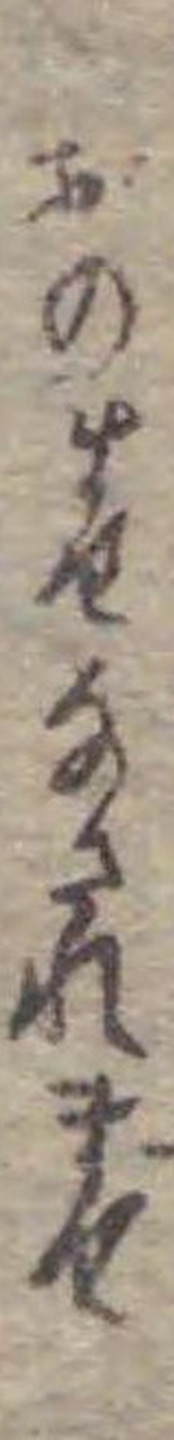おのませなされませ
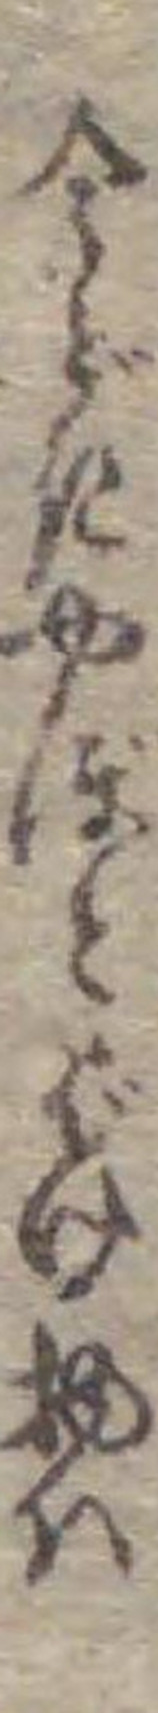今どきやぼとばけ物は
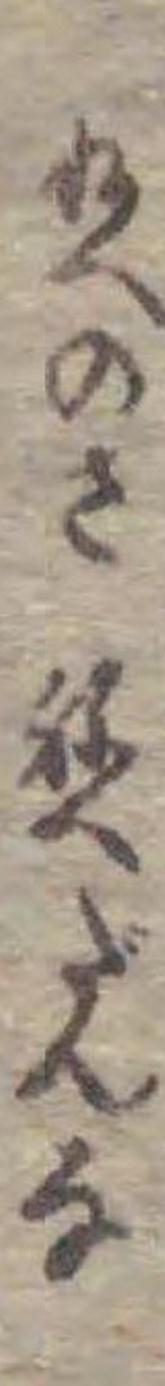ねへのさねへだんな
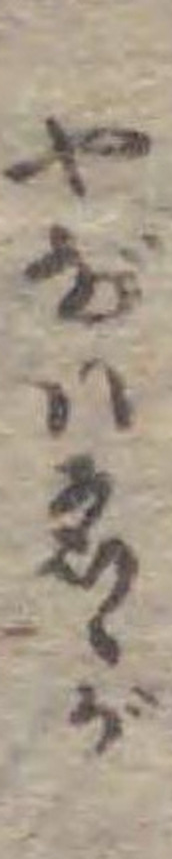やぼはゑゝが
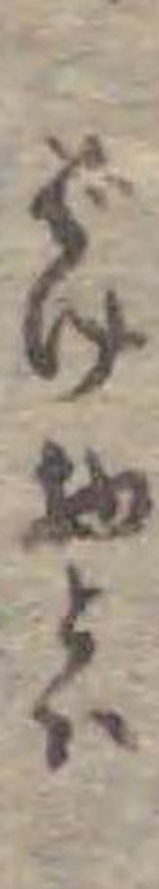ばけ物とは
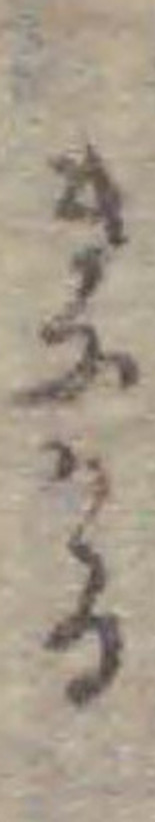きにかゝる
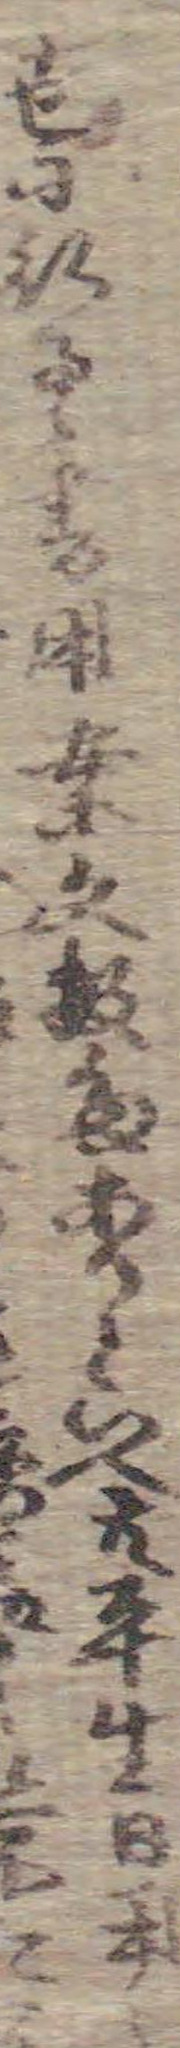世に行事の書用案文数多ありといへ共平生日用の
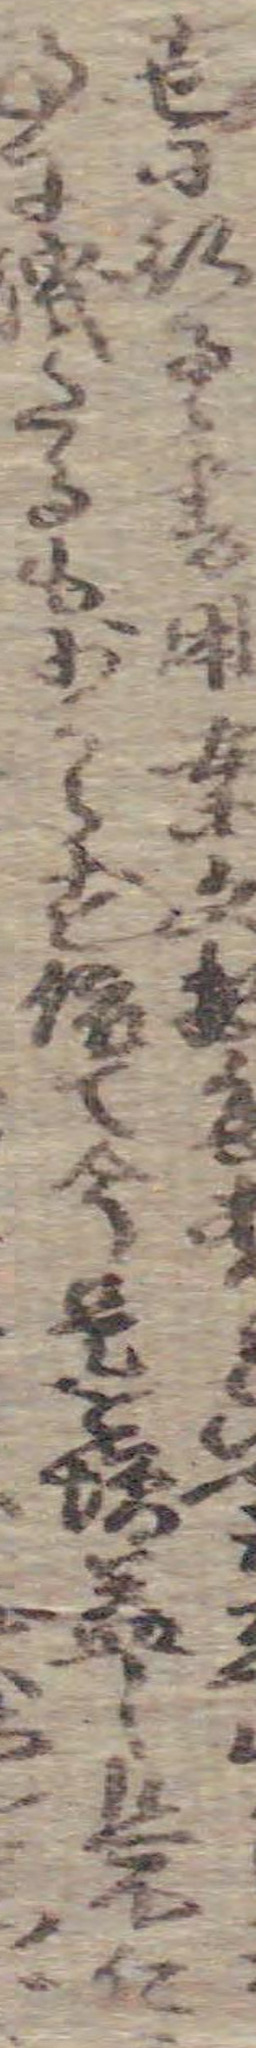事に洩たるも少からず依て今是を増益し且不仁不
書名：[化物一代記] : 5巻
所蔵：国立国会図書館 National Diet Library, JAPAN
